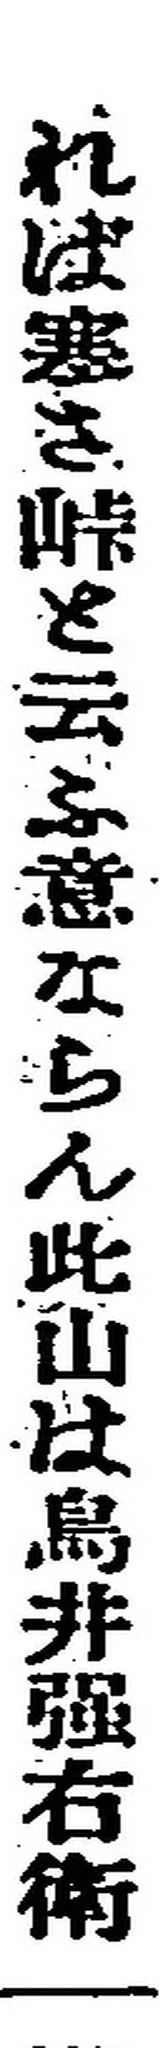れば寒さ峠と云ふ意ならん此山は鳥井強右衛
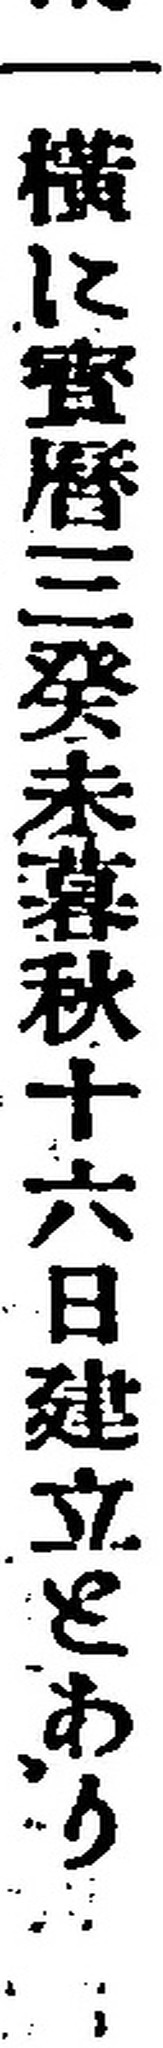横に宝暦三癸未暮秋十六日建立とあり
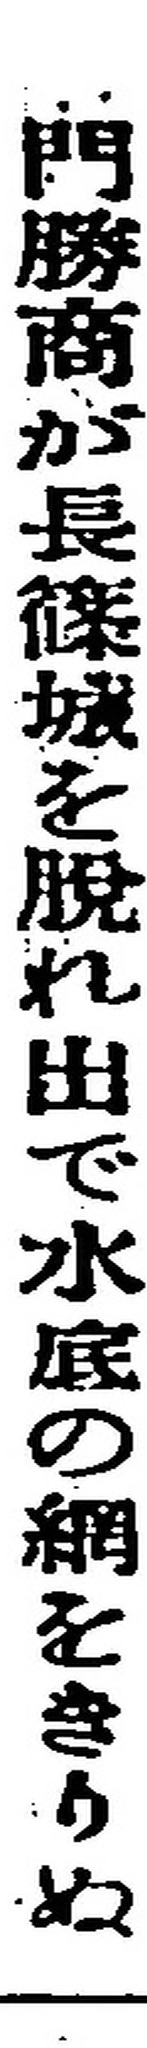門勝商が長篠城を脱れ出で水底の網をきりぬ
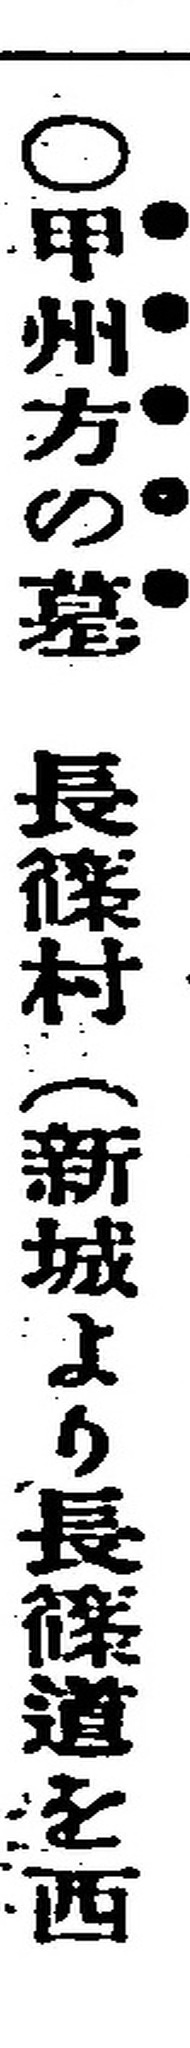○甲州方の墓長篠村(新城より長篠道を西
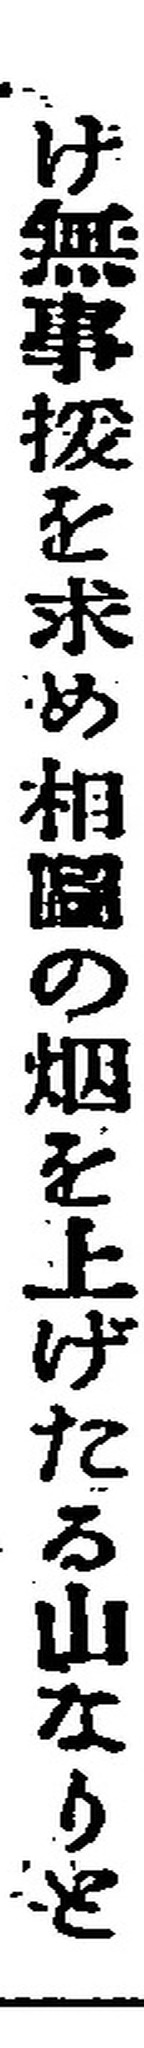け無事援を求め相図の烟を上げたる山なりと
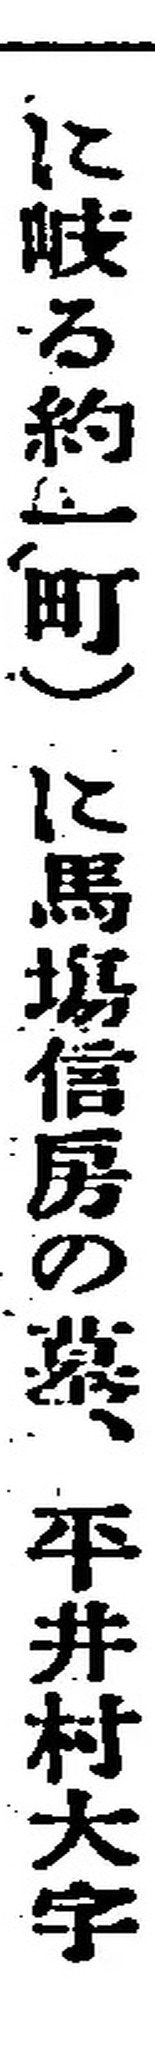に岐る約一町)に馬場信房の墓、平井村大字
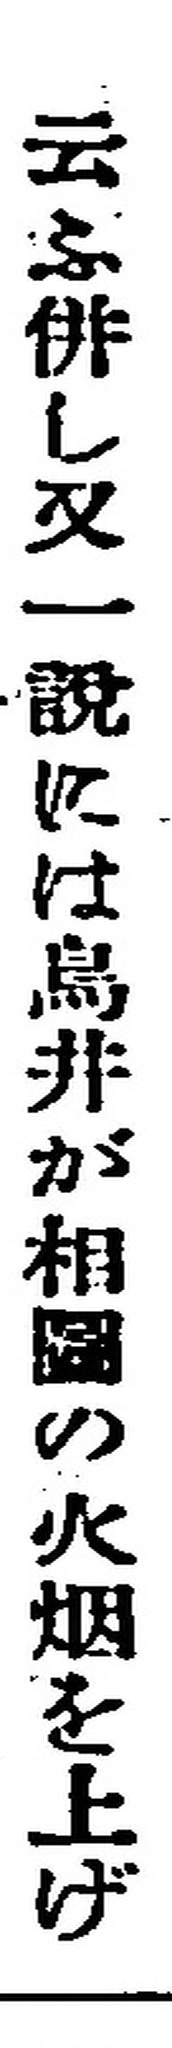云ふ併し又一説には鳥井が相図の火烟を上げ
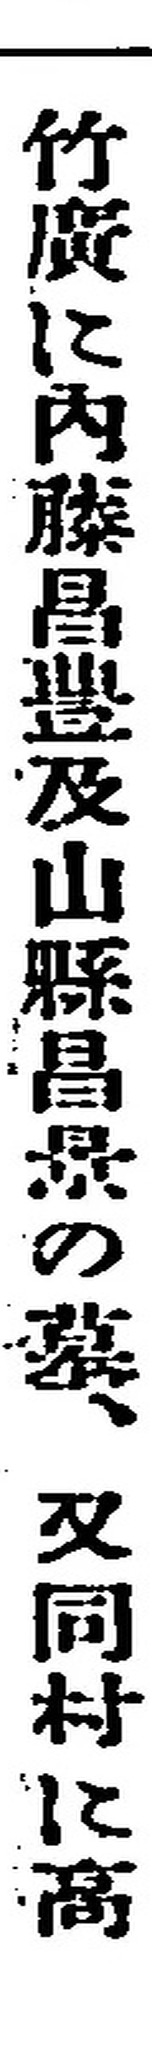竹広に内藤昌豊及山県昌景の墓、又同村に高
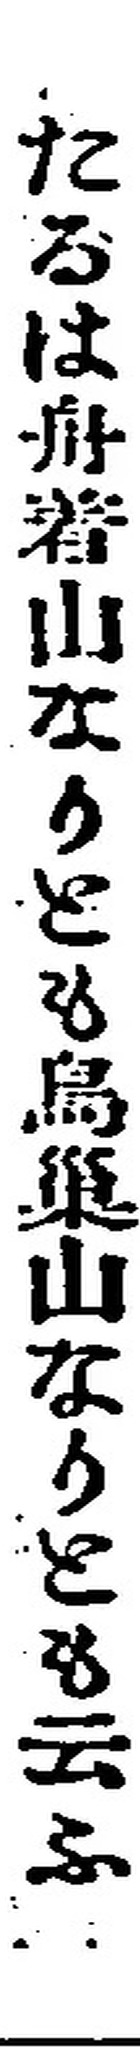たるは舟着山なりとも鳥巣山なりとも云ふ
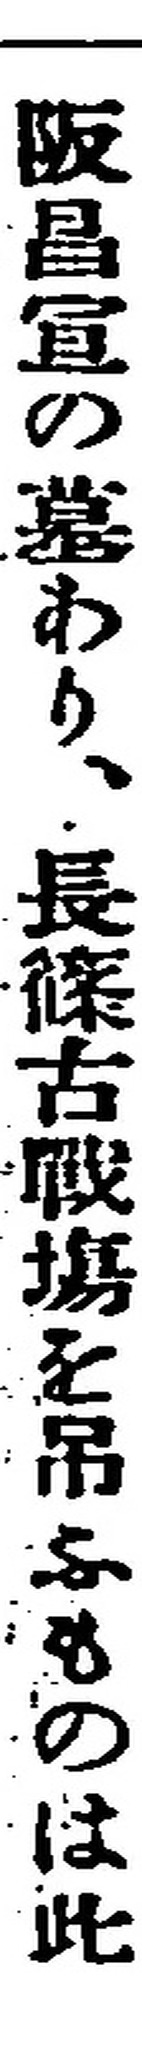阪昌宣の墓あり、長篠古戦場を吊ふものは此
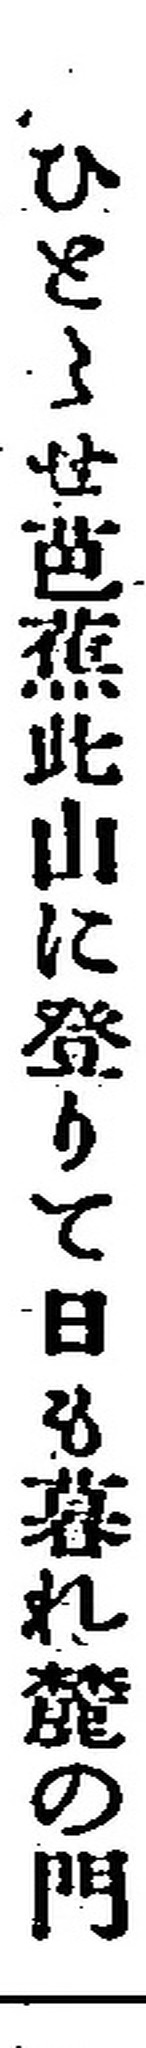ひとゝせ芭蕉此山に登りて日も暮れ麓の門
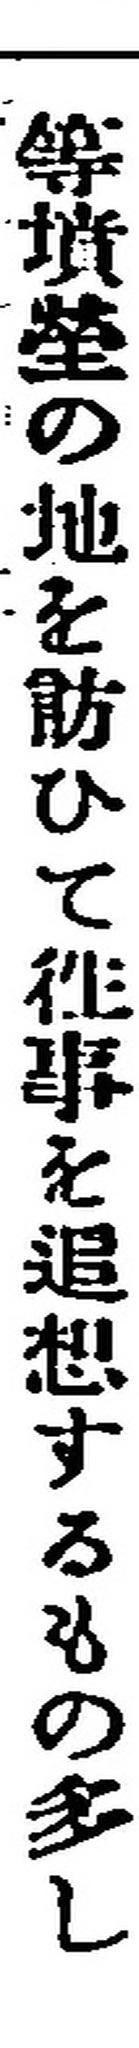等墳塋の地を訪ひて往事を追想するもの多し
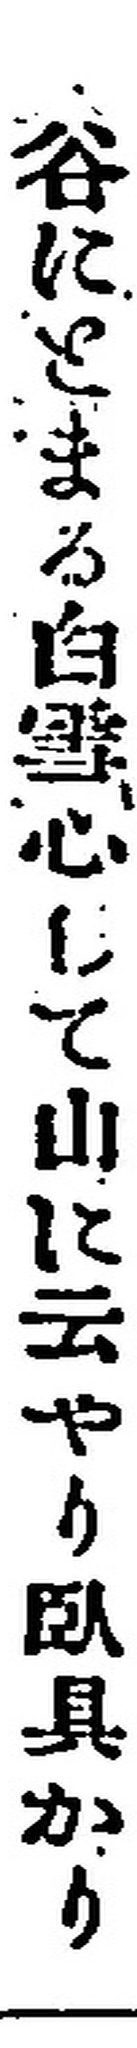谷にとまる白雪心して山に云やり臥具かり
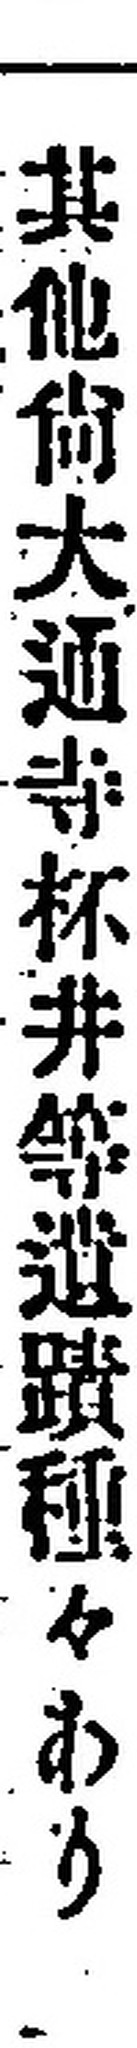其他尚大通寺杯井等遺蹟種々あり
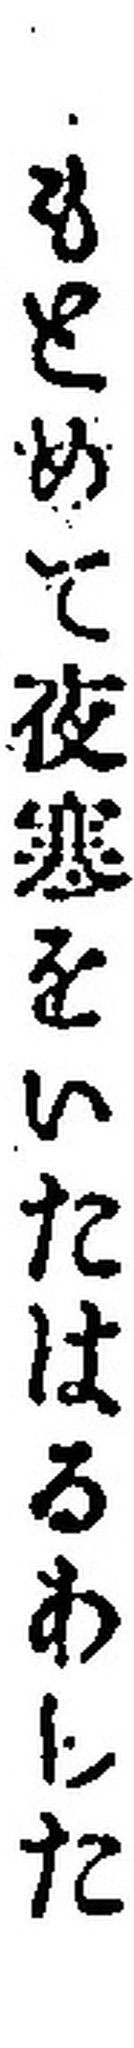もとめて夜寒をいたはるあした
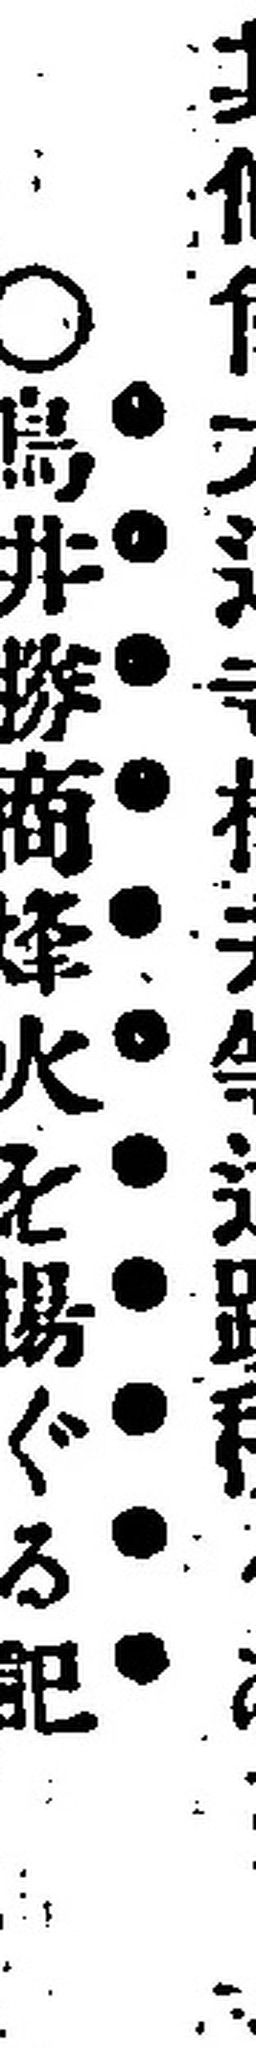○鳥井勝商烽火を揚ぐる記
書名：東参名勝案内
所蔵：国立国会図書館 National Diet Library, JAPAN
